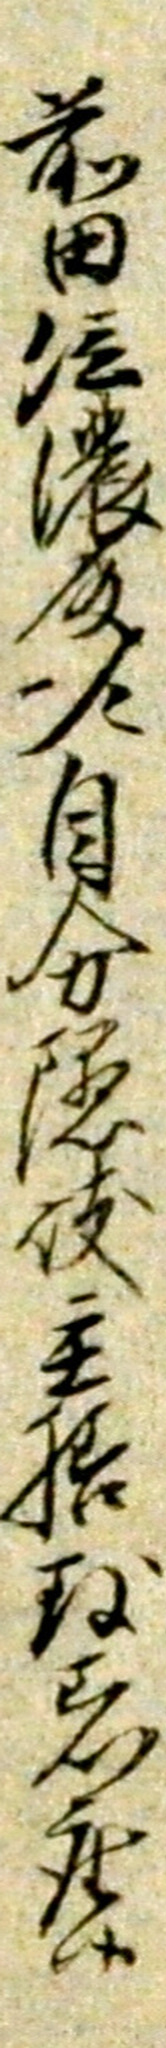前田信濃殿次自分隠岐主膳致着座候
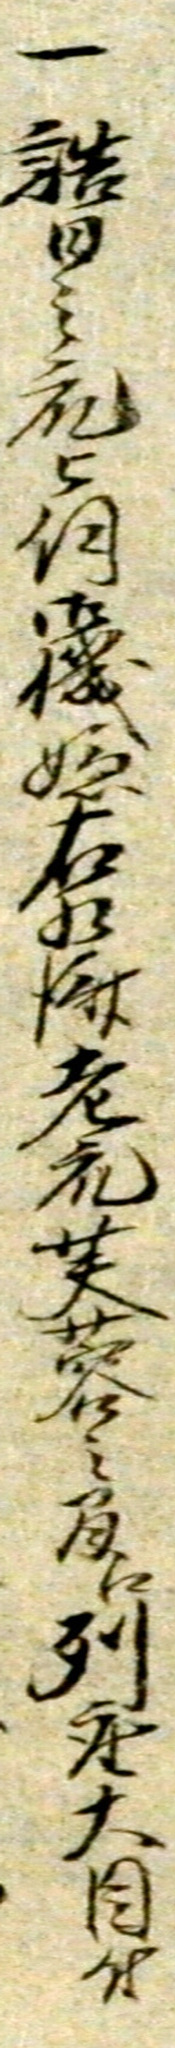一詰日之衆被伺御機嫌右相済老衆芙蓉之間江列座大目付
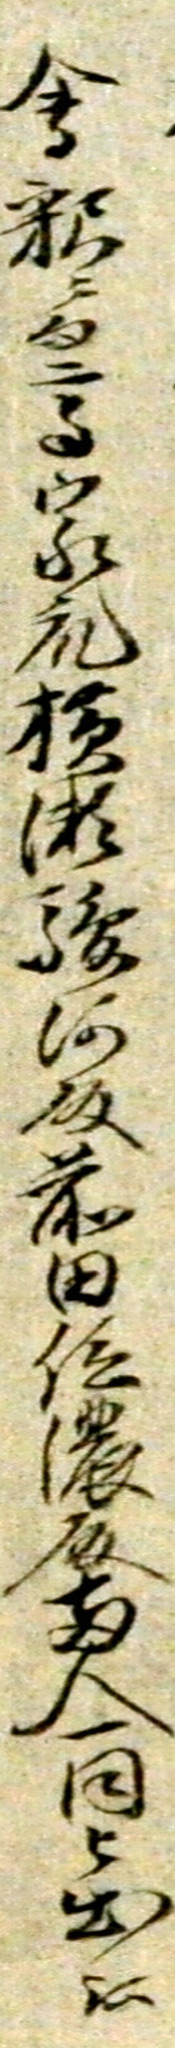会釈ニ而高家衆横瀬駿河殿前田信濃殿両人一同被后
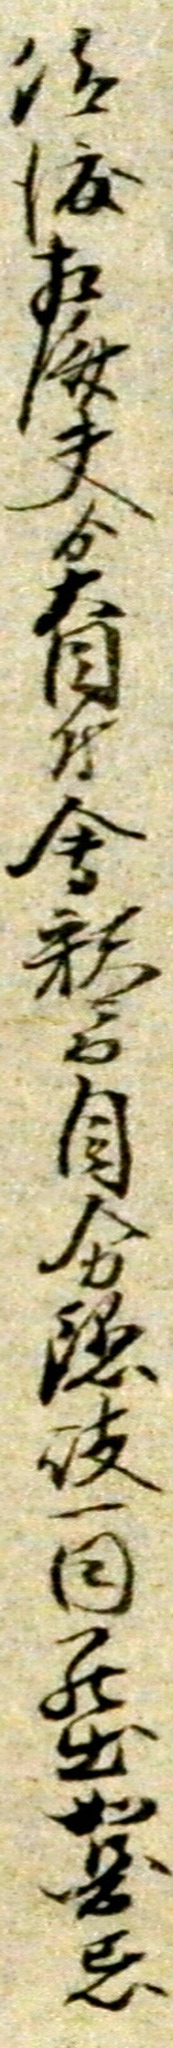仰渡相済夫ゟ大目付会釈ニ而自分隠岐一同罷出如図着座
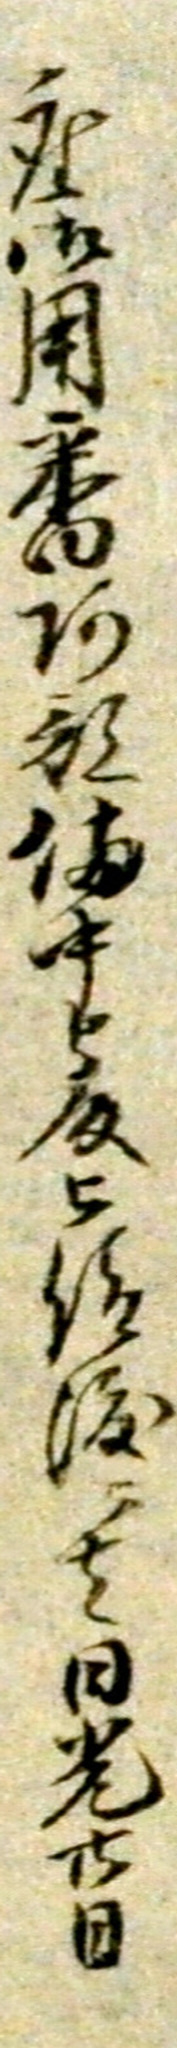御用番阿部備中守殿被仰渡ニ者日光廿日
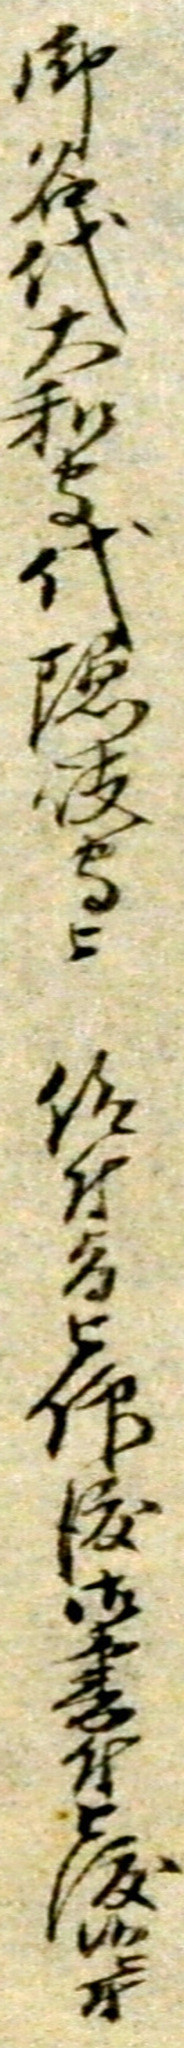御名代大和守代隠岐守被仰付旨被仰渡御書付被渡候二付
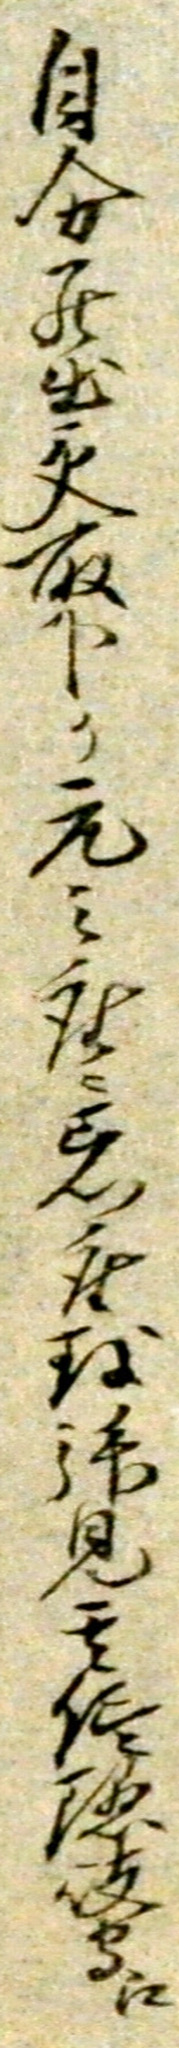自分罷出受取下ㇼ元之座ニ着座致拝見其儘隠岐守江
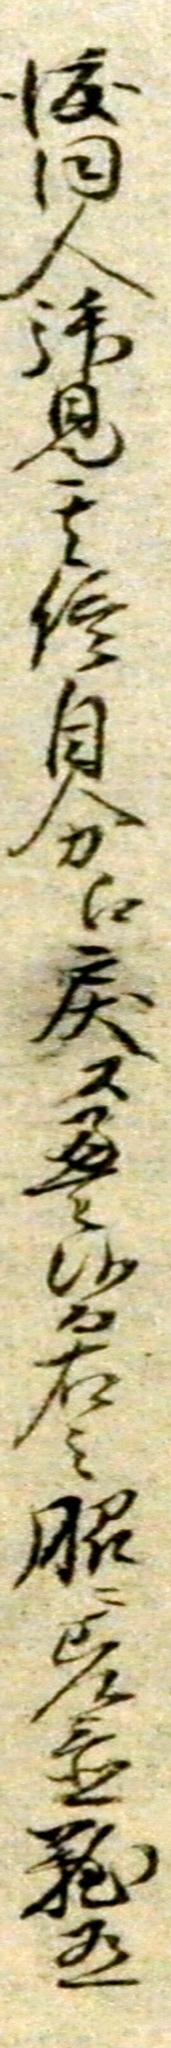渡同人拝見其儘自分江戻ㇲ畳候而右之脇ニ差置難有
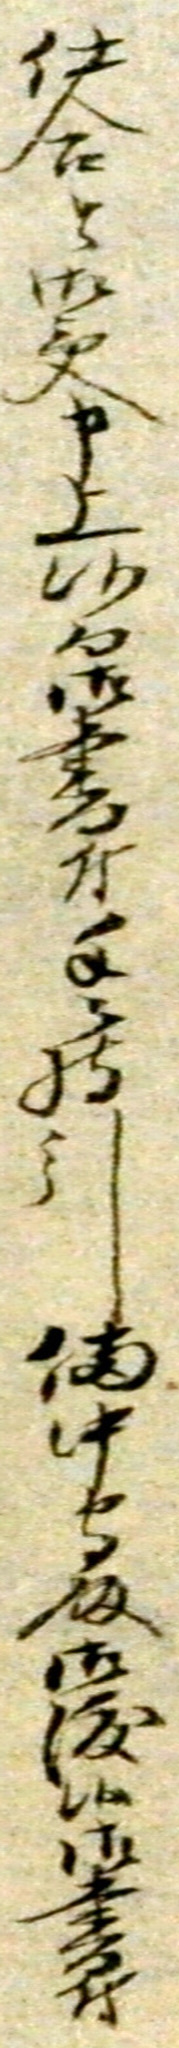仕合と御受申上候而御書付手ニ持引備中守殿御渡候御書付
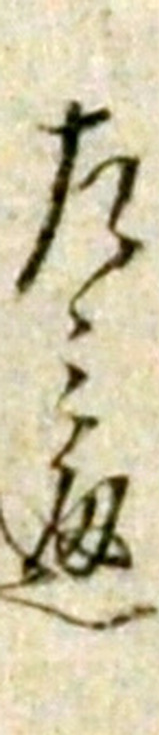左之通
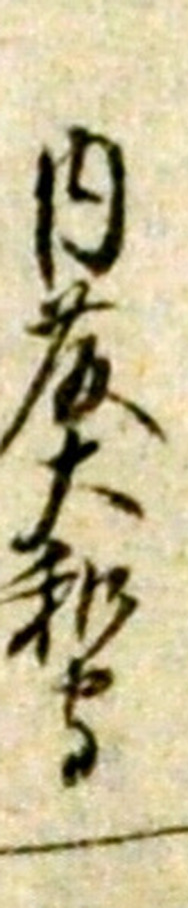内藤大和守
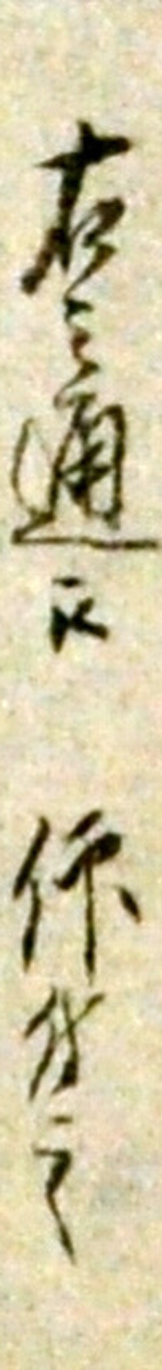右之通被仰付之
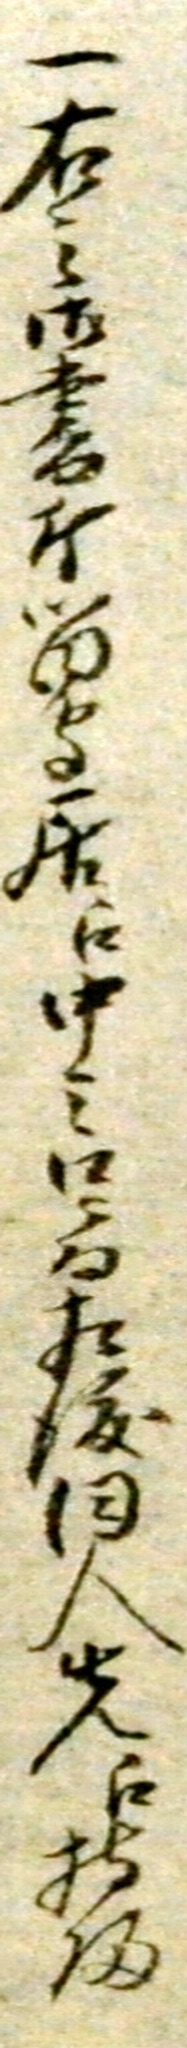一右之御書付留守居江中之口尓ニ而相渡同人先江持帰
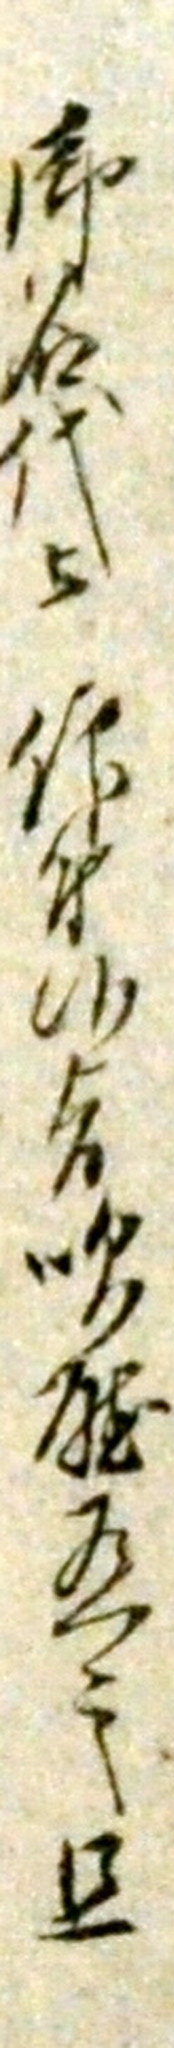御名代被仰付候旨吹聴有之且
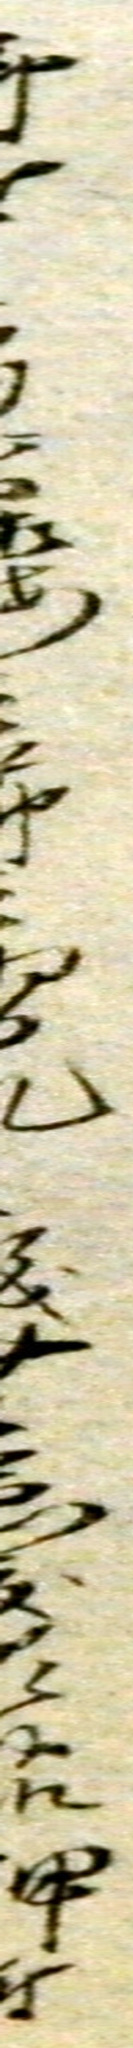御座之間ニ而御暇之節之習礼之儀無急度頼候処押付

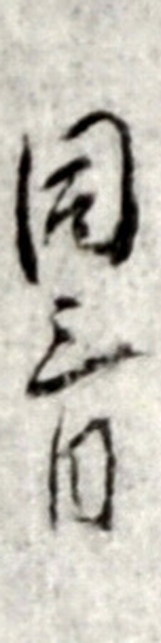同三月
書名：日光御名代相勤候節ノ留
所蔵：伊那市立高遠町図書館・合同会社AMANE
